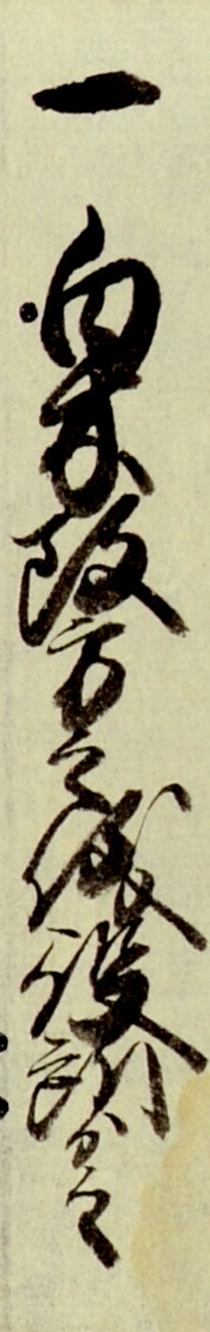一白木改方之儀役所ゟ者
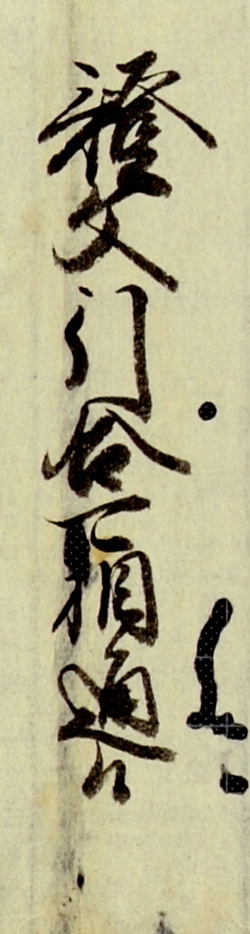証文引合可相通候
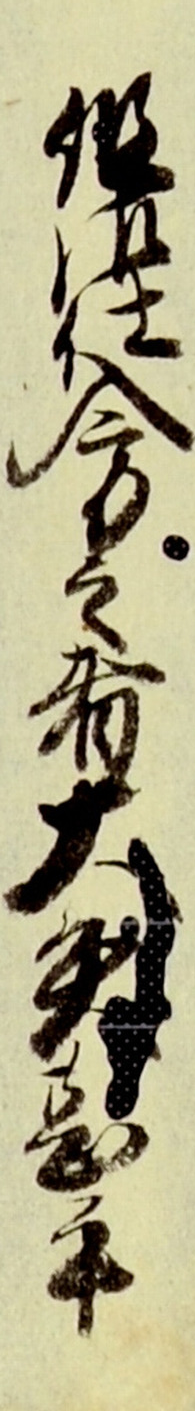但御仕入方之者大矢甚平
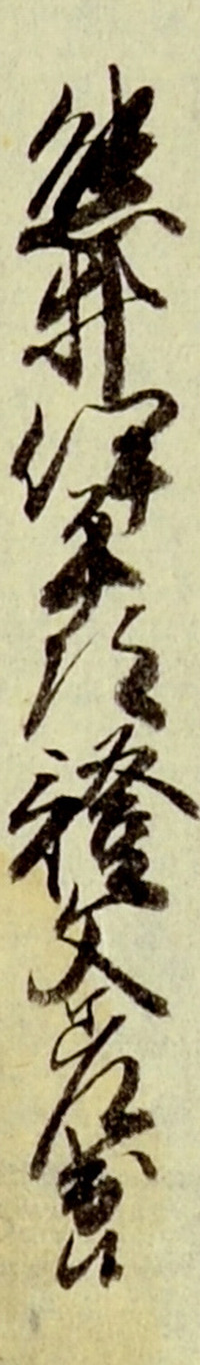熊井伊平次証文差出候
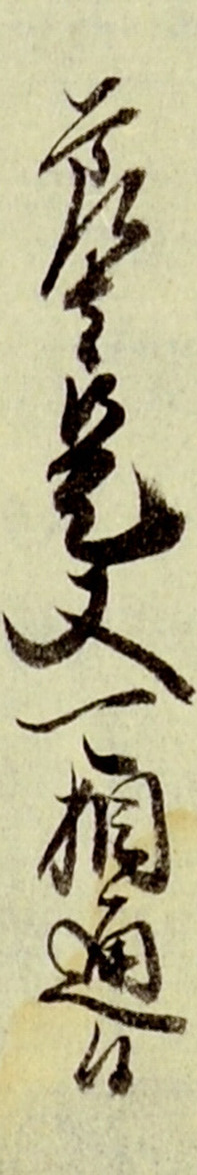節者是又可相通候
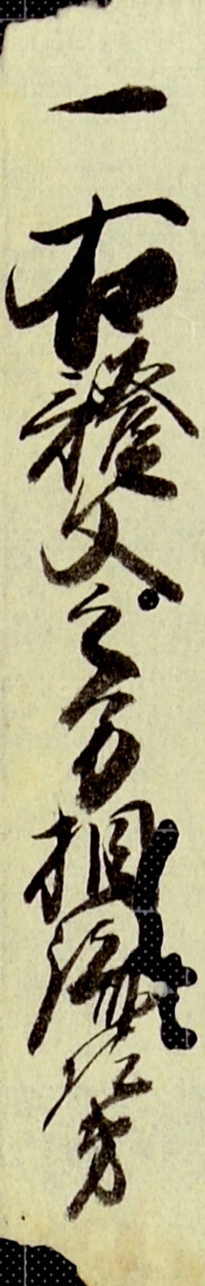一右証文之分相済次第
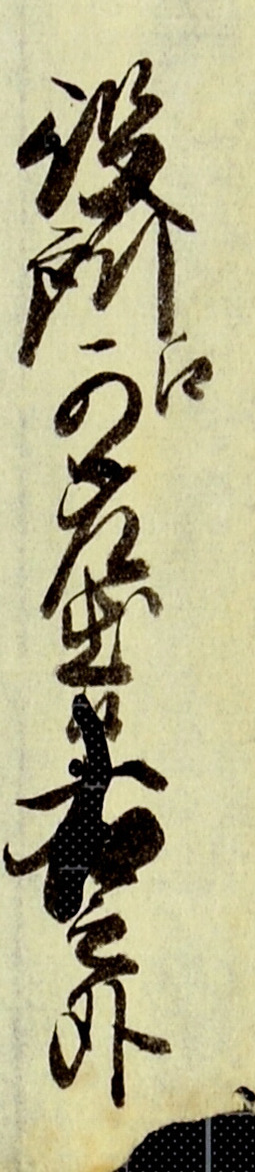役所江可差出候右之外
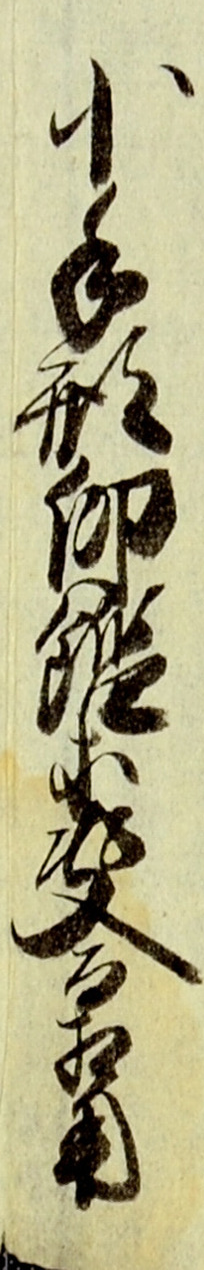小切手印鑑等決而相用
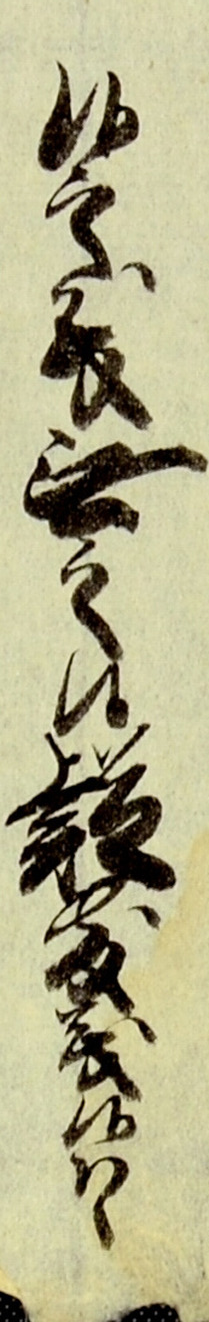候之義無之候難敷義候ハゝ
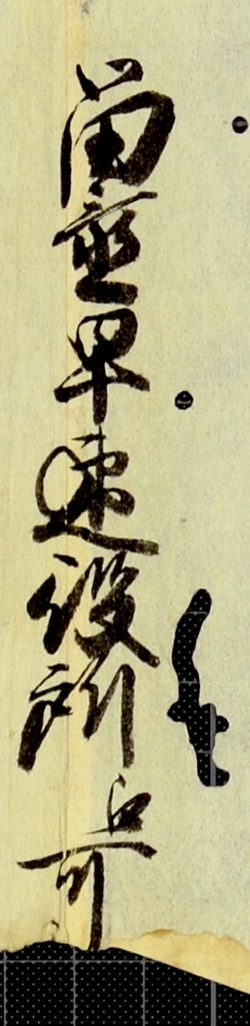留置早速役所江可
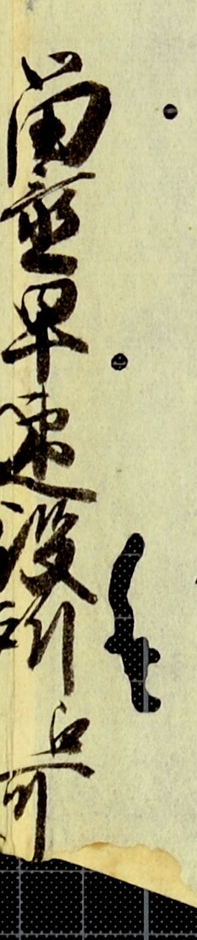留置早速役所江可
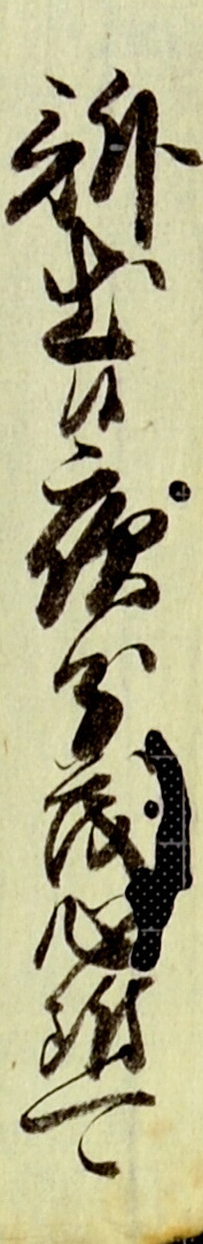訴出候夜分茂心附可
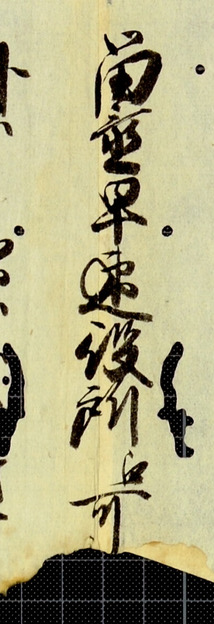留置早速役所江可
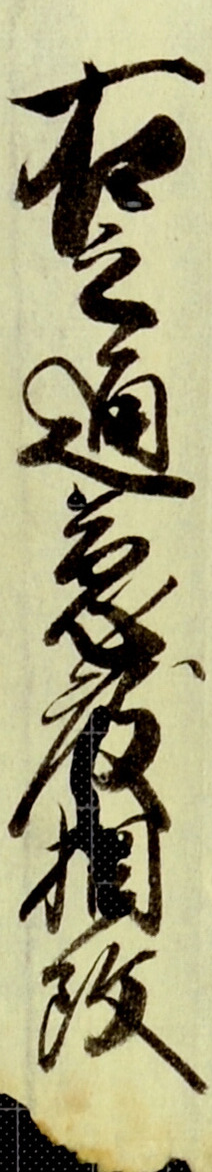右之通急度相改
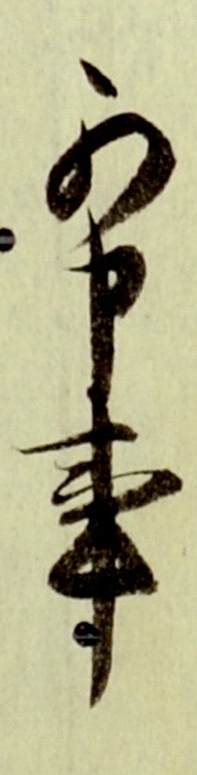可申事
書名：覚
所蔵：伊那市立高遠町図書館・合同会社AMANE
